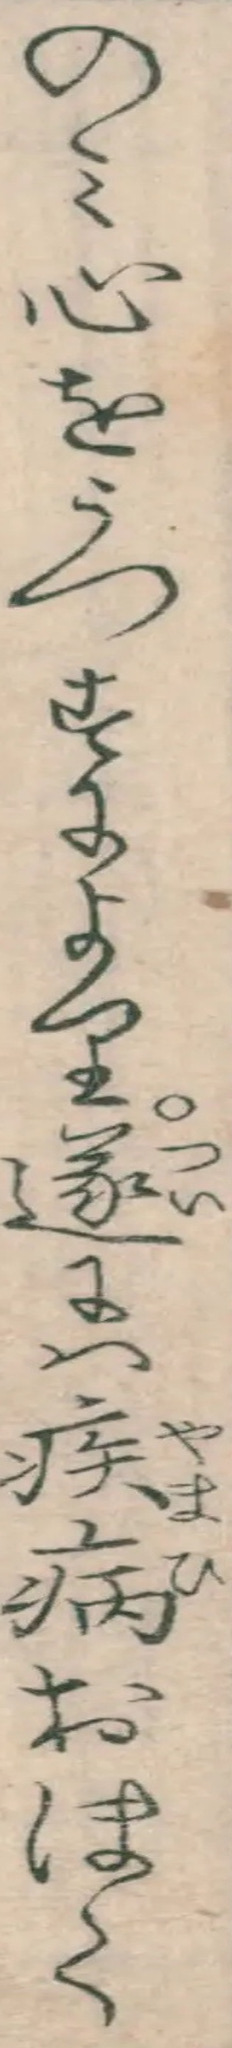のみ心肝をうつすにより。遂には疾病おほく
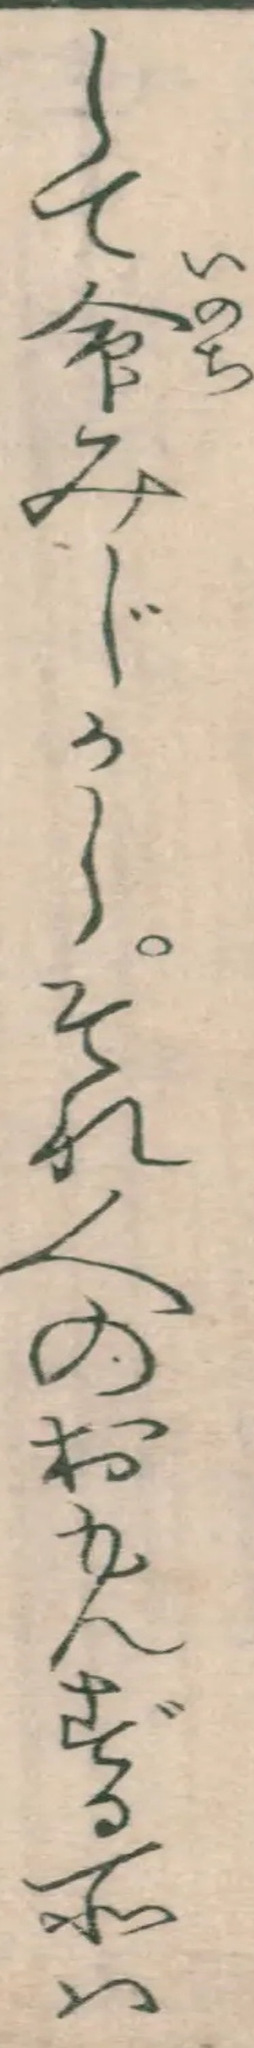して命みじかし。それ人のおもんずる所は
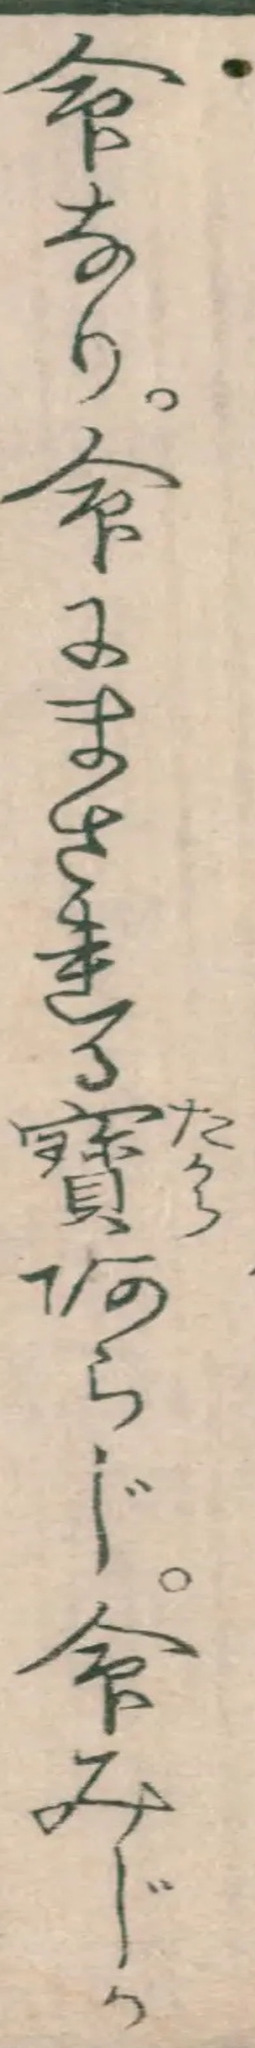命なり。命にまされる寳あらじ。命みじか
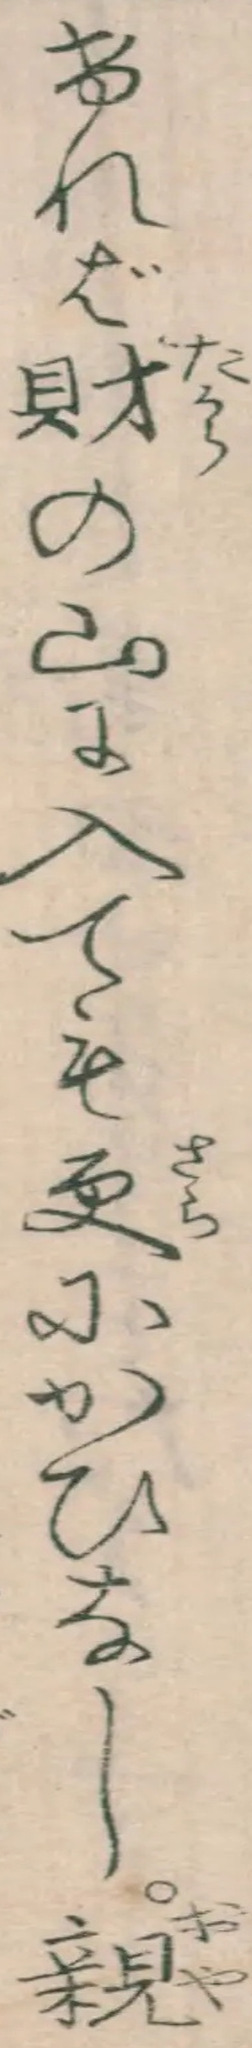なれば財の山に入ても更にかひなし。親
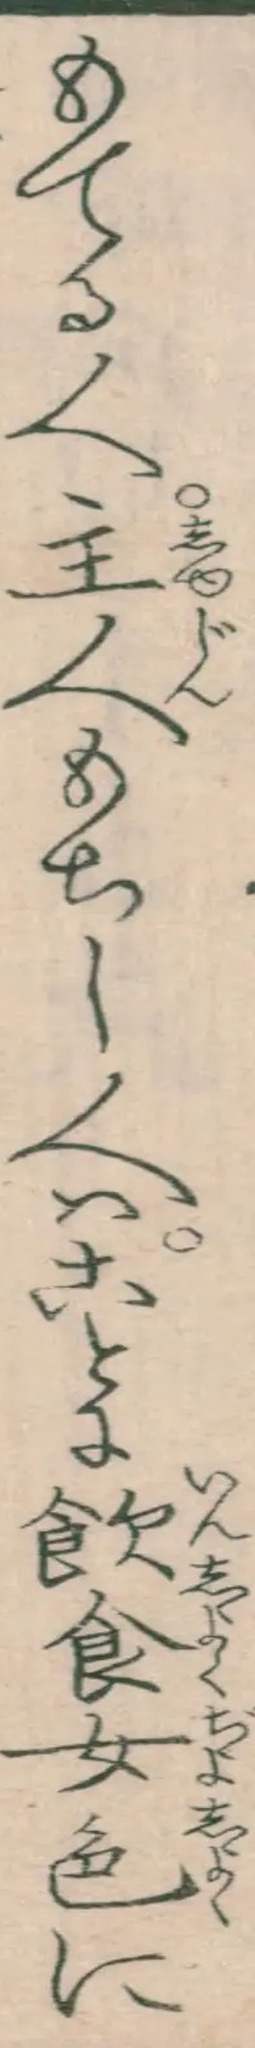もてる人主人もちし人は。ことに飲食女色に
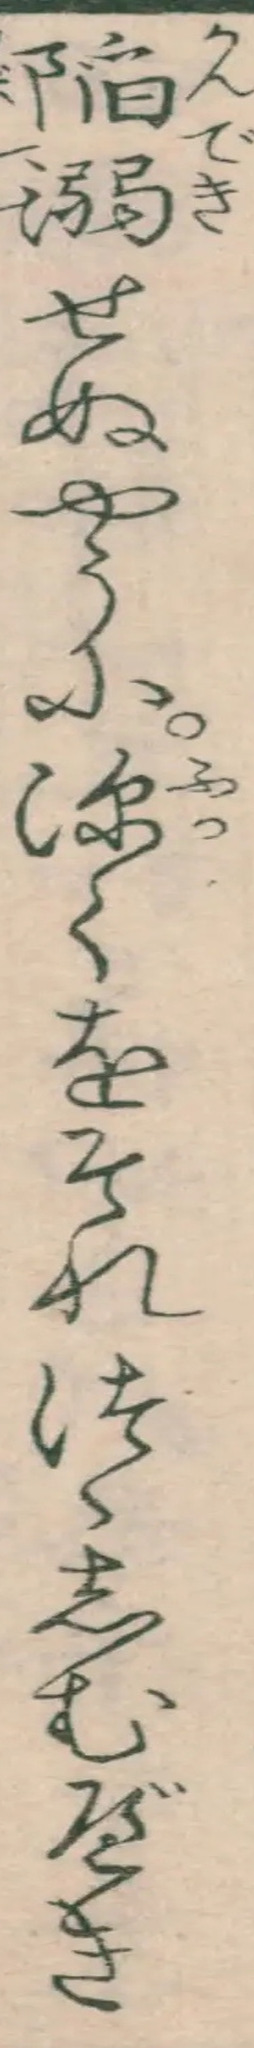陥溺せぬやうに。深くをそれつゝしむべき
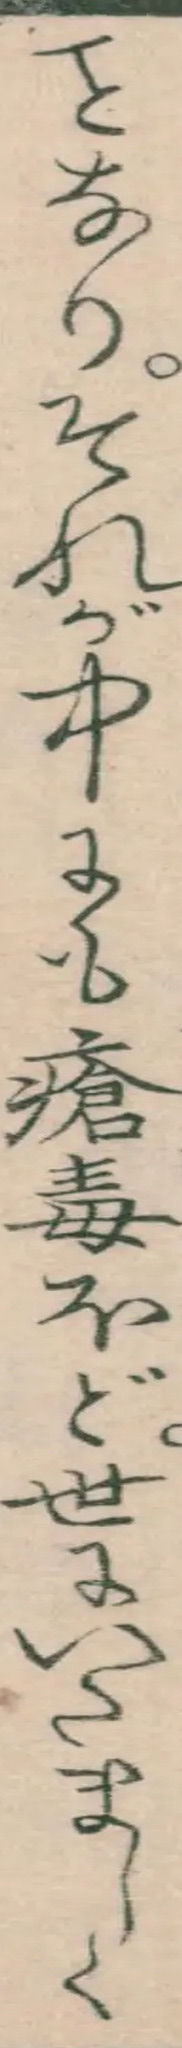ことなり。それが中にも瘡毒ほど。世にいたましく
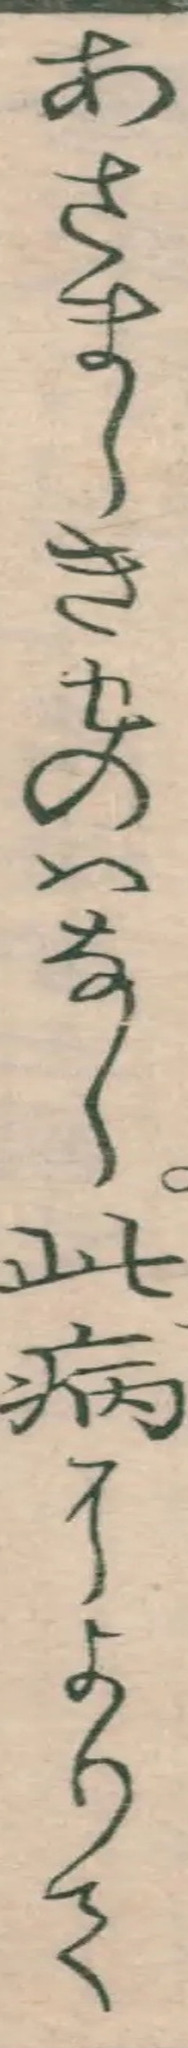あさましきものはなし。此病によりて
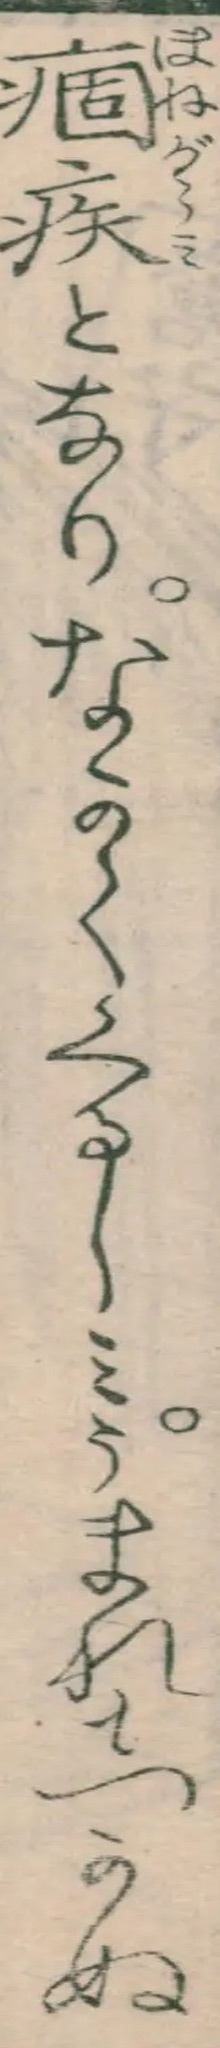痼疾となり。なかくくるしみ。うまれもつかぬ
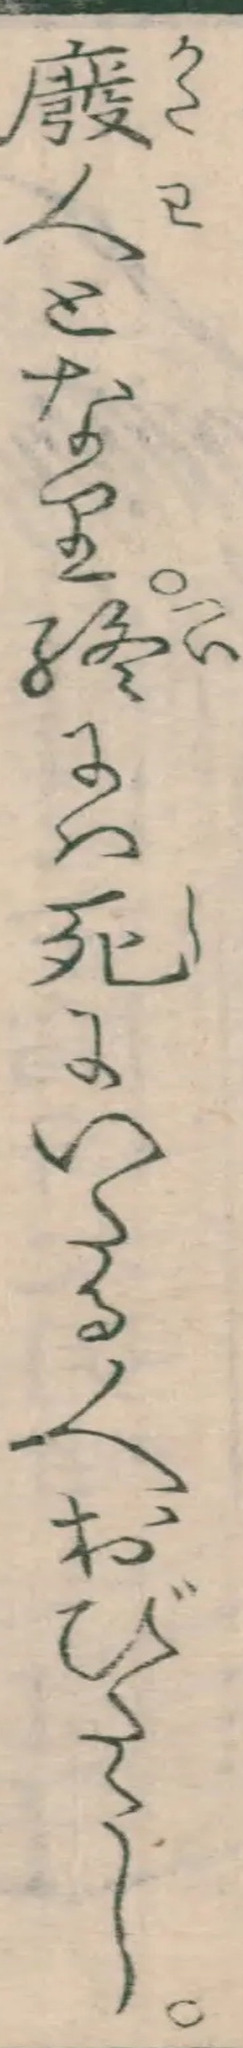廃人となり。終には死にいたる人おびたたし。
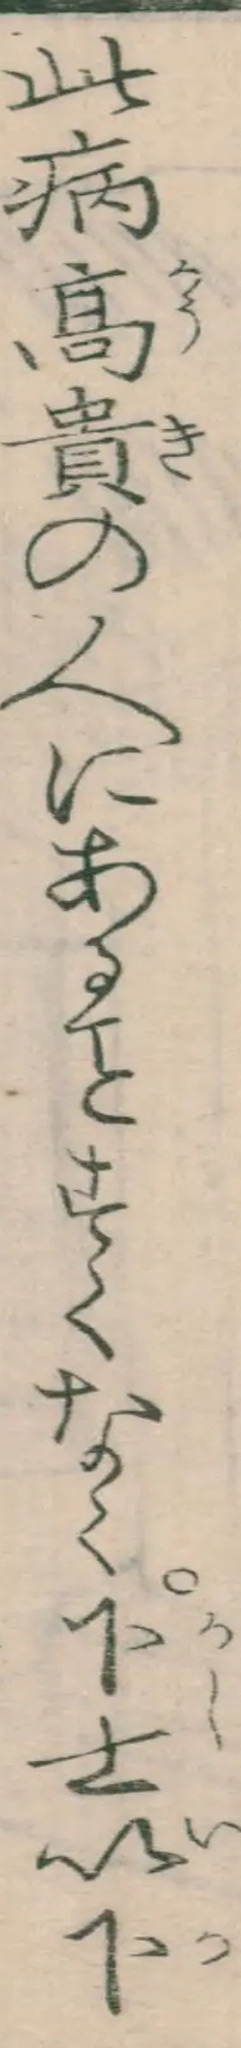此病高貴の人にあることすくなく。下士以下
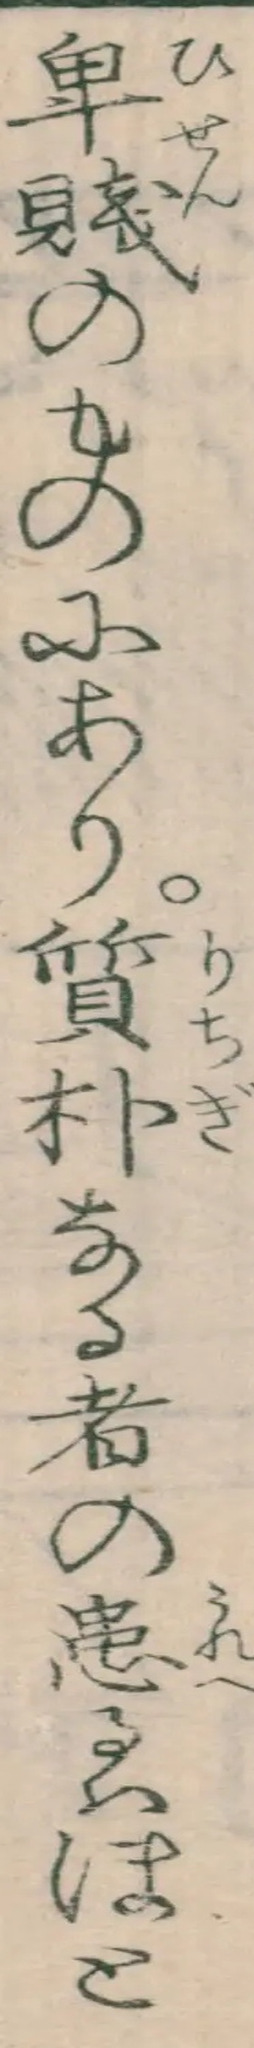卑賎のものにあり。質朴なる者の患るはほと
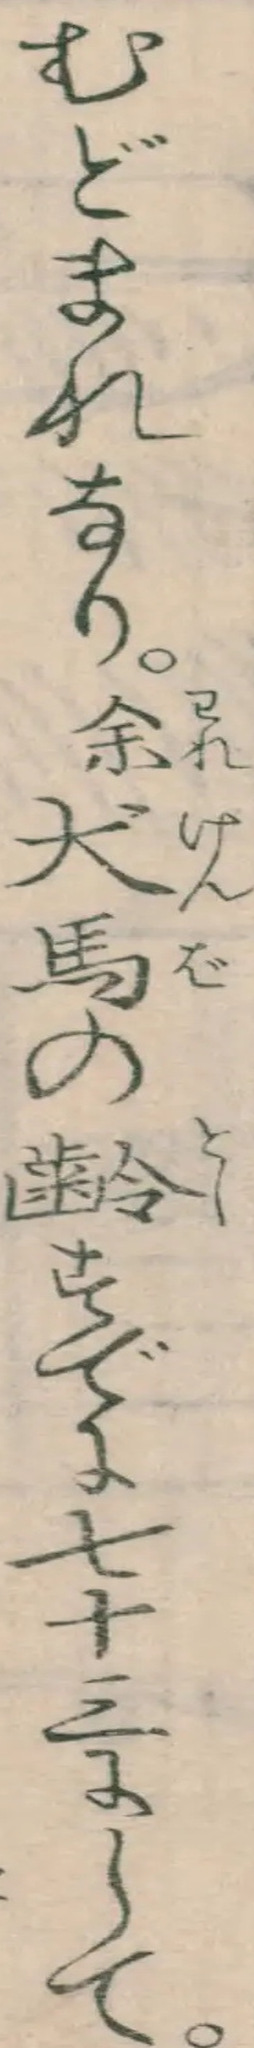ぬどまれなり。余犬馬の齢すでに七十三にして。
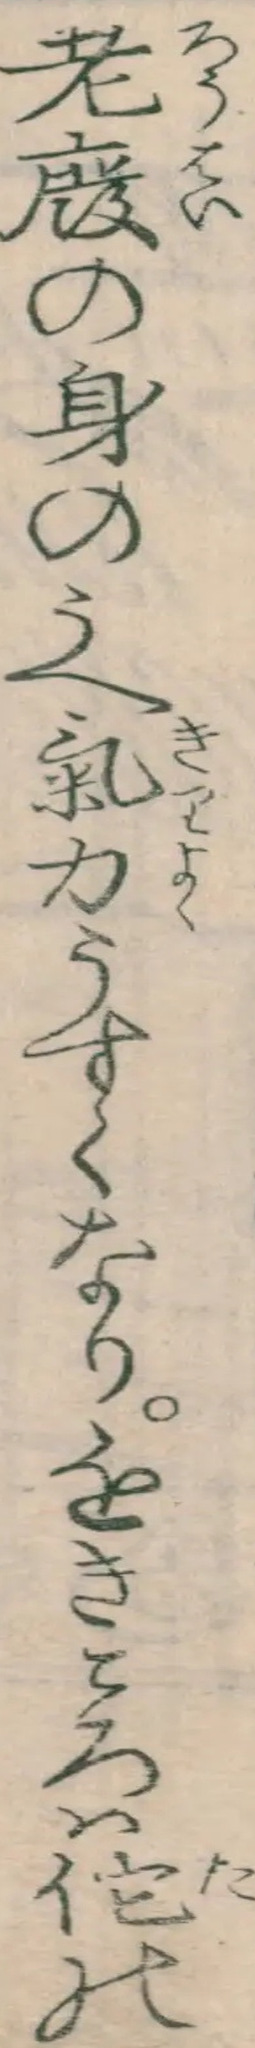老廢の身のうへ氣力うすくなり。近きころは佗の
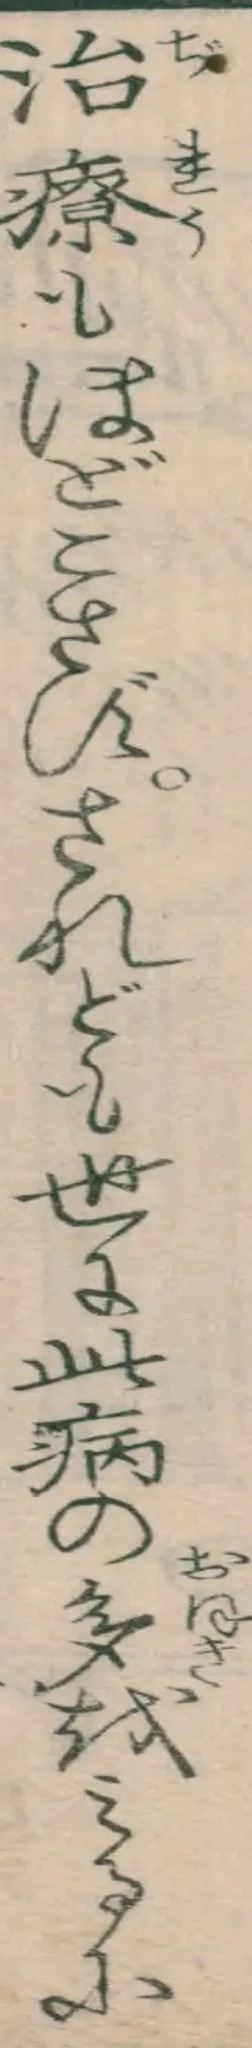治療もほどこあず。されども世に此病の多をみるに
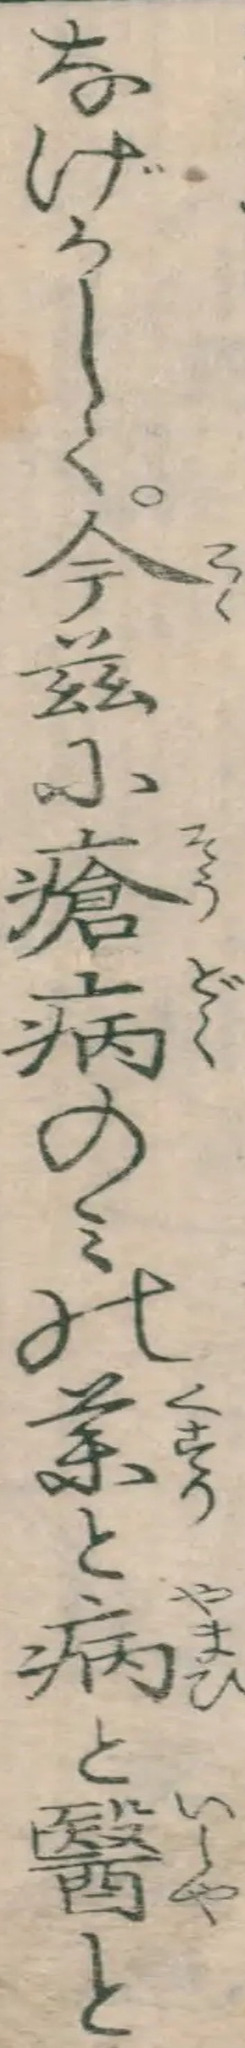なげかしく。今茲に瘡毒のみの薬と病と醫と
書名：瘡家示訓
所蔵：国立国会図書館 National Diet Library, JAPAN
